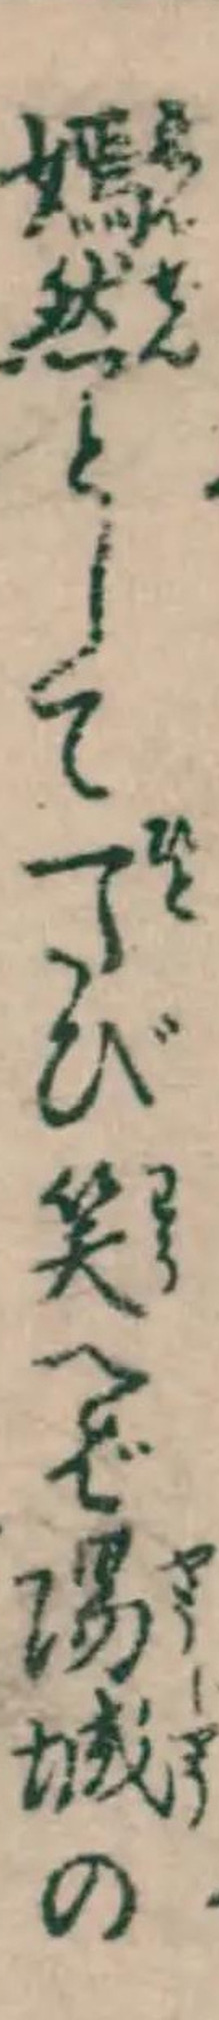嫣然として一たび笑へば陽城の
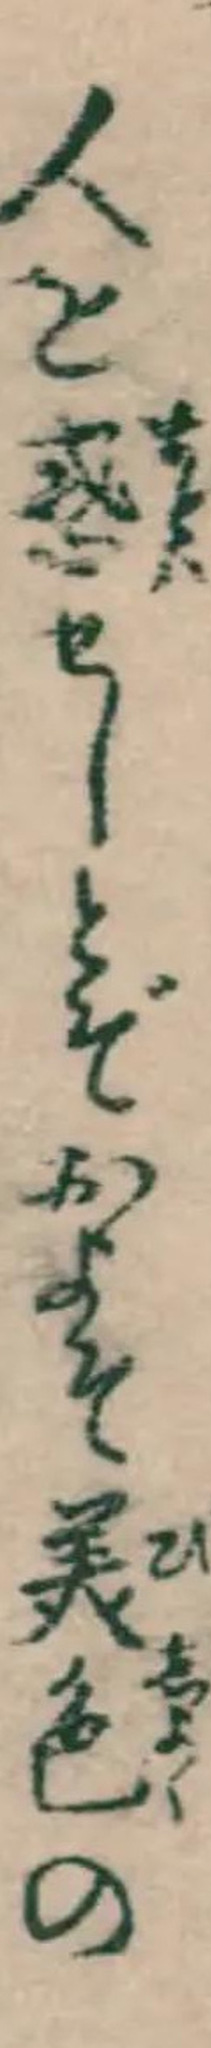人を惑せしとぞおよそ美色の
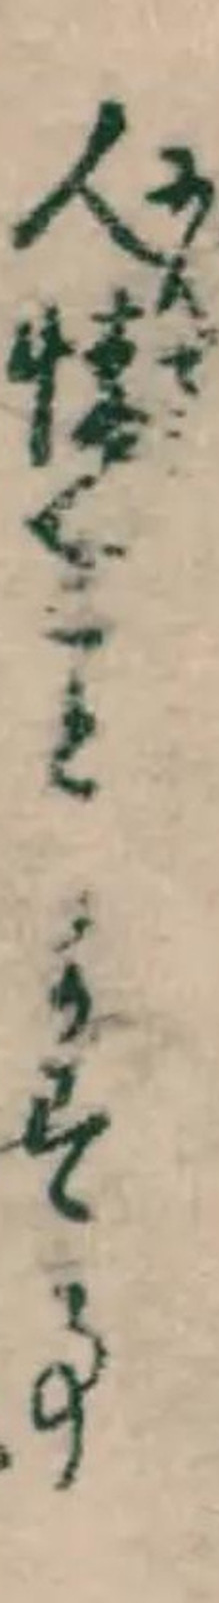人情をとかす事
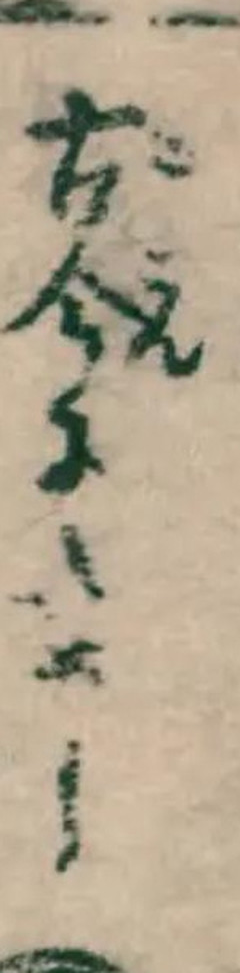古今にためし
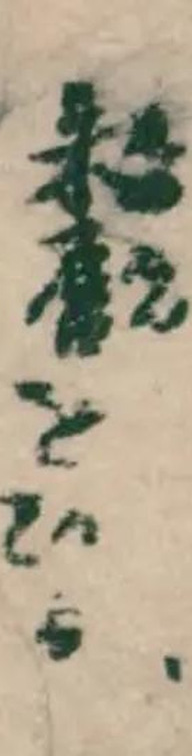朱唇をひる
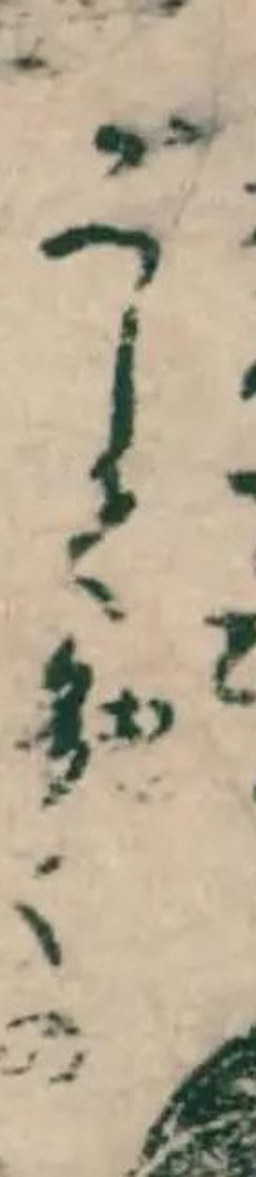がへして多くの
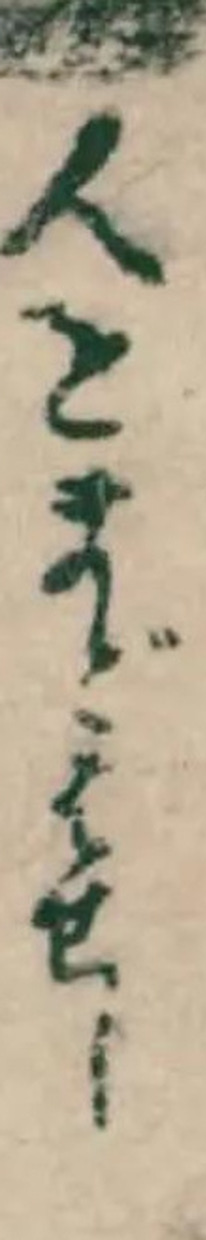人をまどはせし

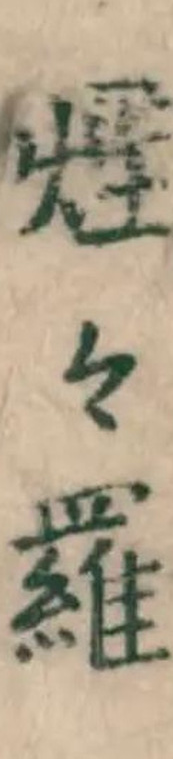煙々羅
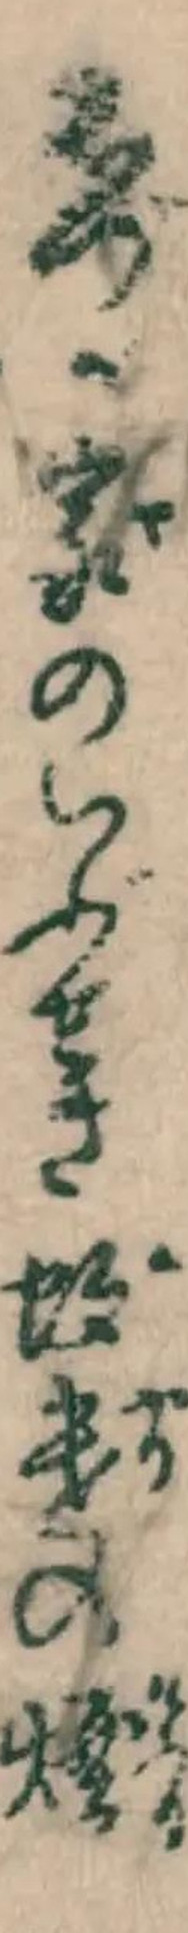しづが家のいぶせき蚊遣の煙
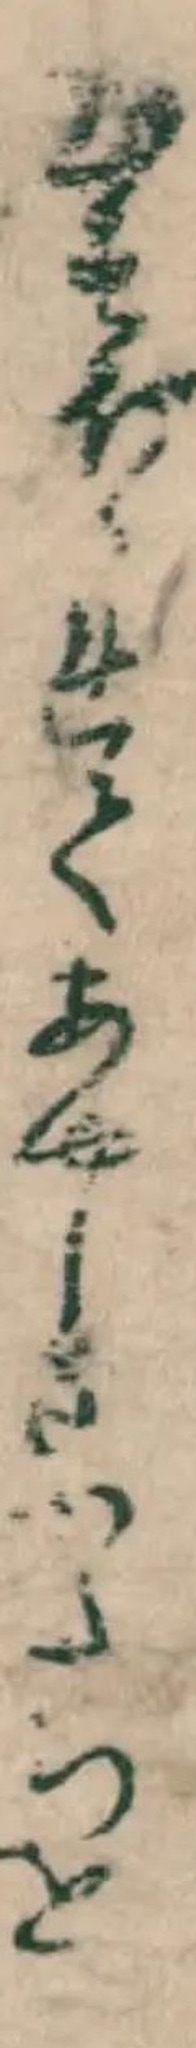むすぼられてあやしきかたちを
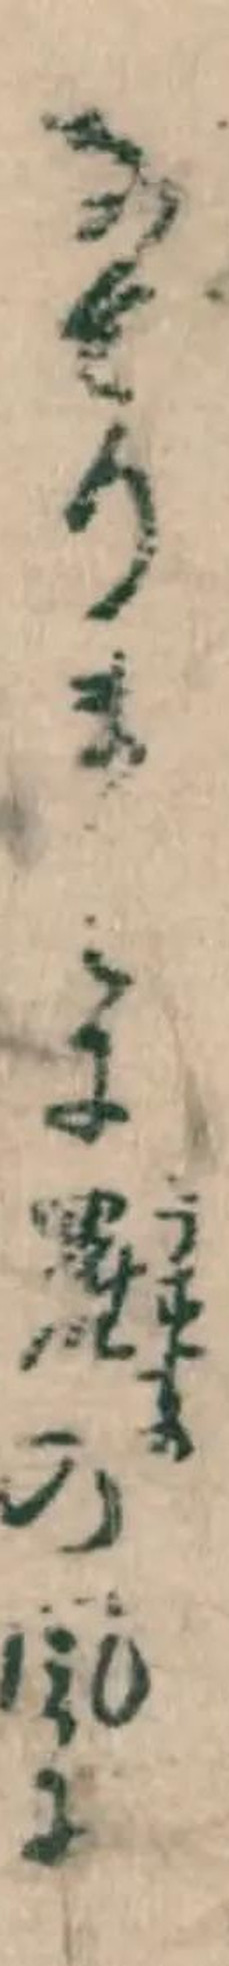なせりまことに羅の風に
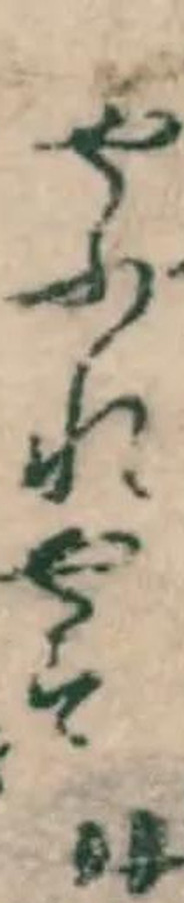やぶれやす
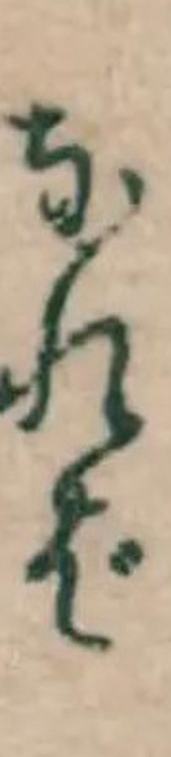なれば
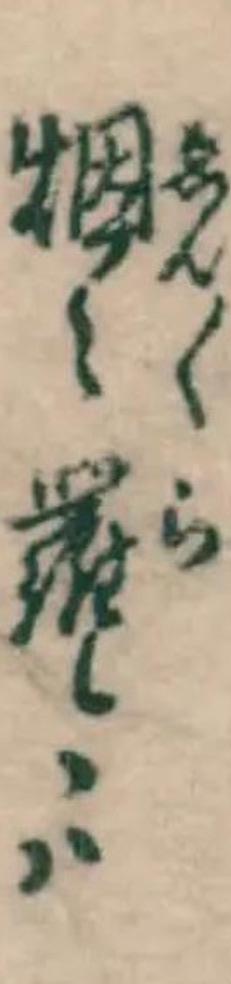烟々羅とは
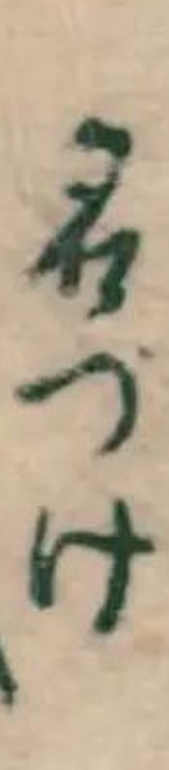名づけ

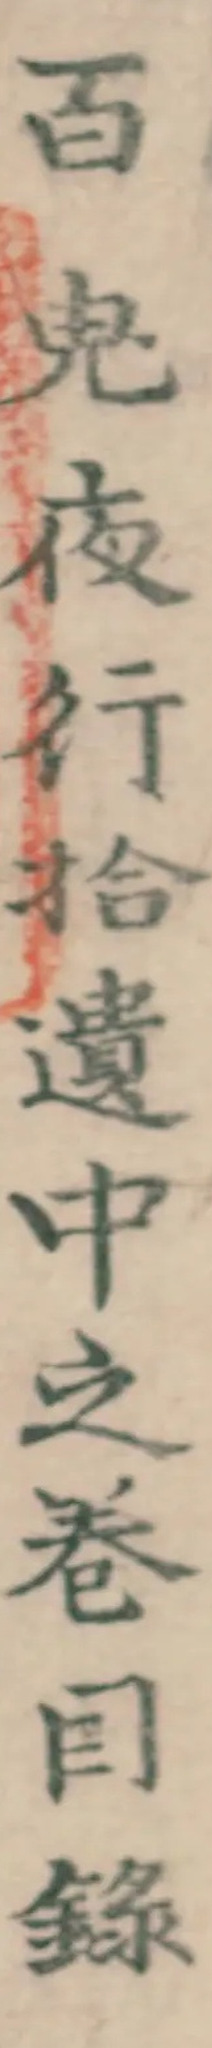百鬼夜行拾遺中之巻目録
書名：百鬼夜行 3巻拾遺3巻. [2]
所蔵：国立国会図書館 National Diet Library, JAPAN
